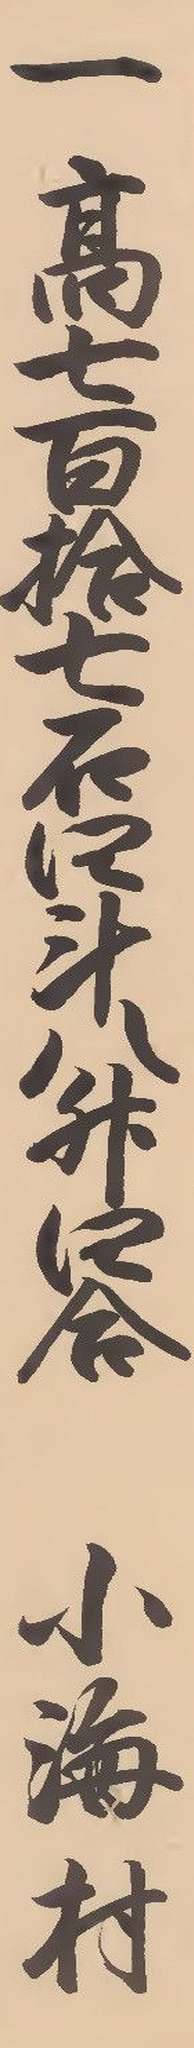一高七百拾七石四斗八升四合小海村
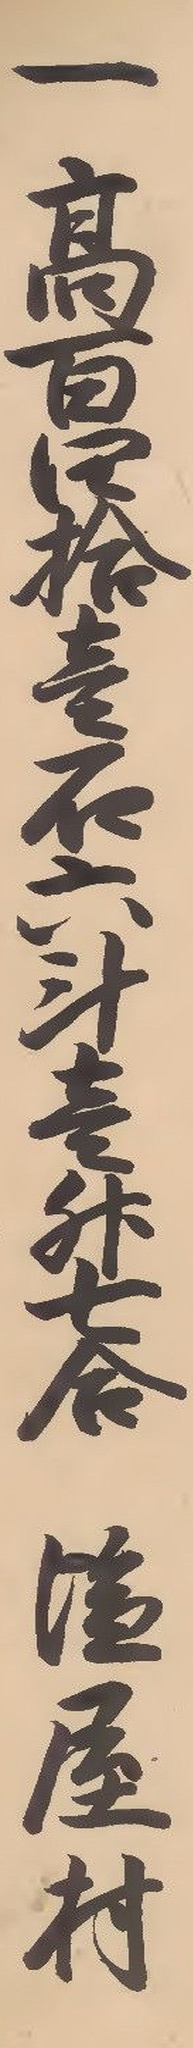一高百四拾壱石六斗壱升七合塩屋村

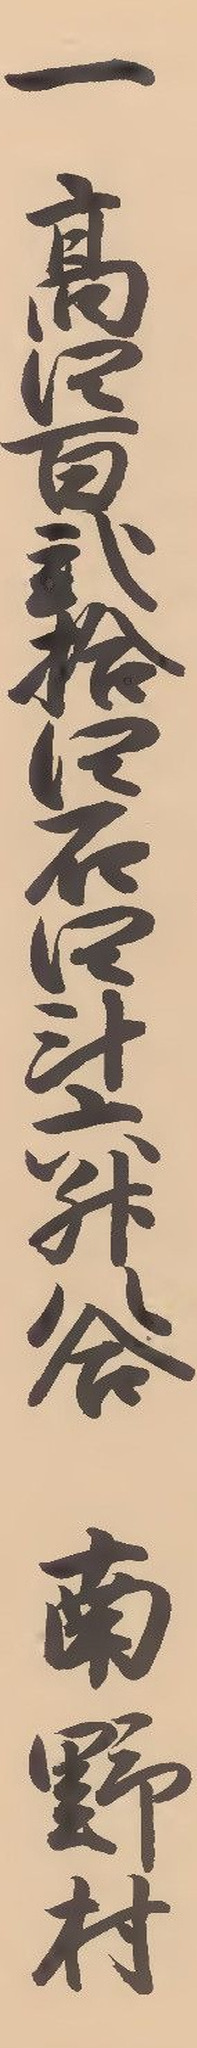一高四百弐拾四石四斗六升八合南野村
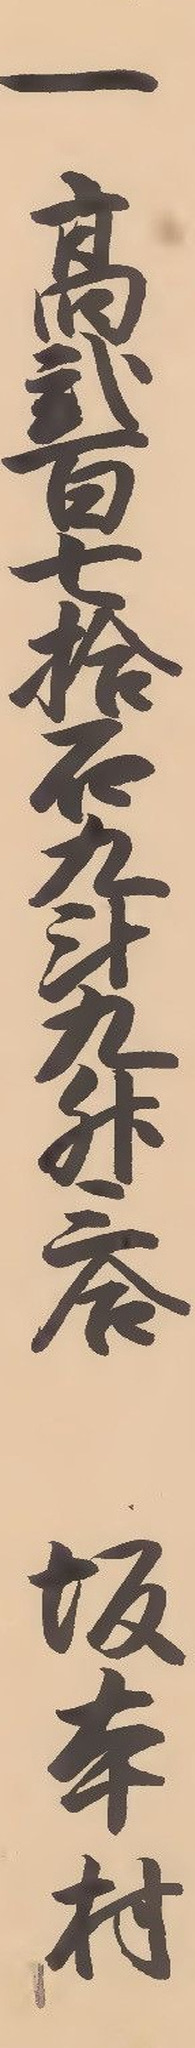一高弐百七拾石九斗九升三合坂本村
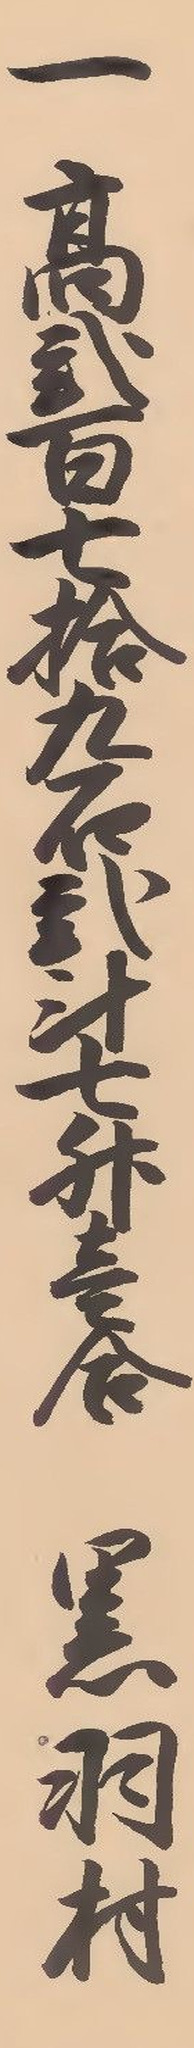一高弐百七拾九石弐斗七升壱合黒羽村
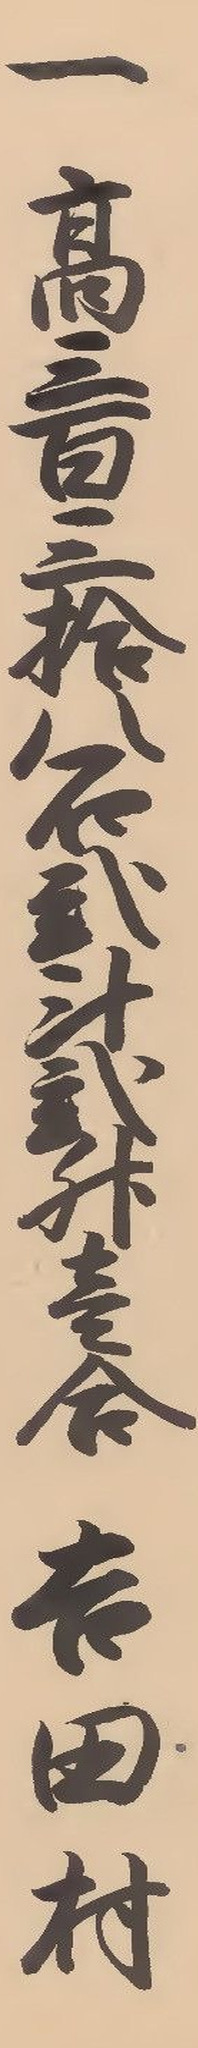一高三百三拾八石弐斗弐升壱合吉田村
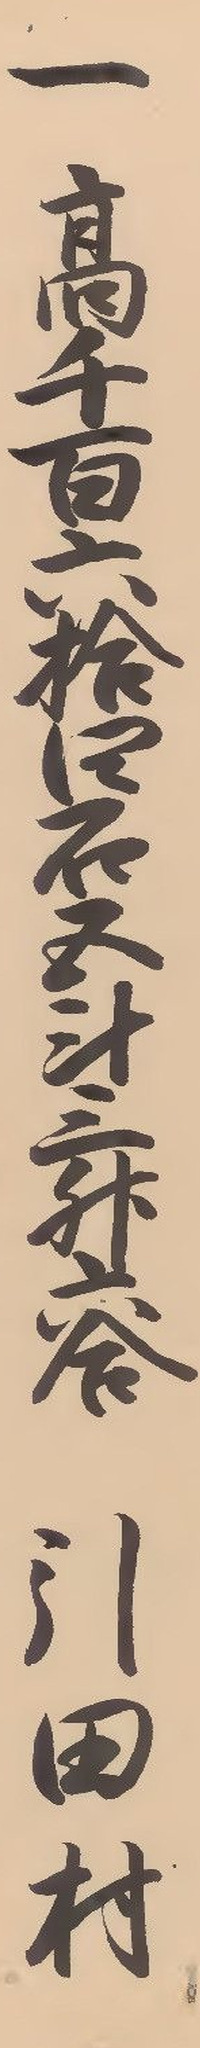一高千百六拾四石五斗三升六合引田村
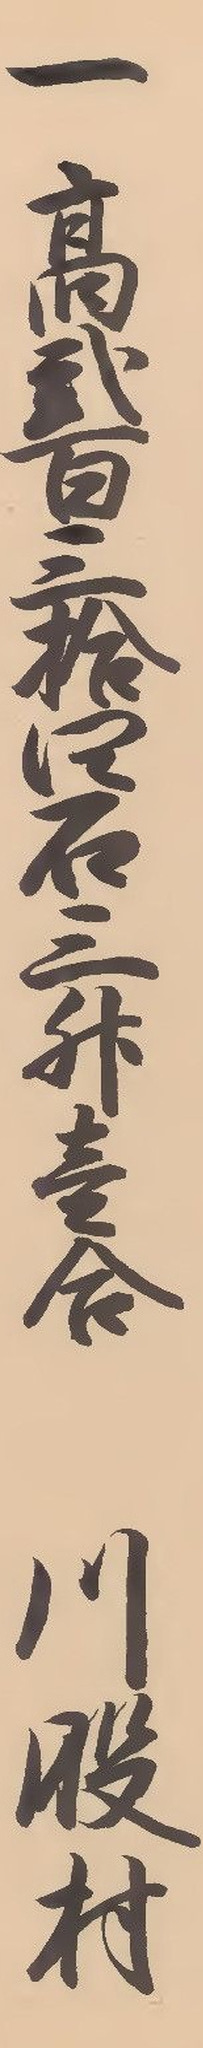一高弐百三拾四石三升壱合川股村
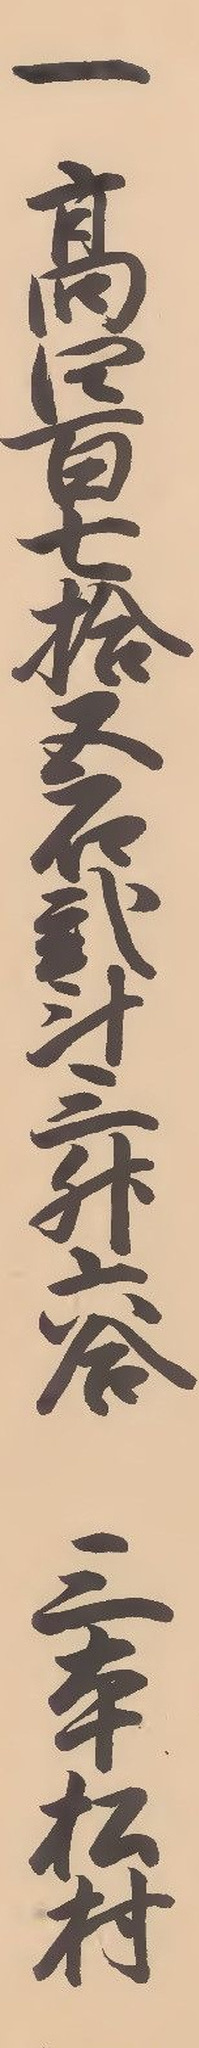一高四百七拾五石弐斗三升六合三本松村

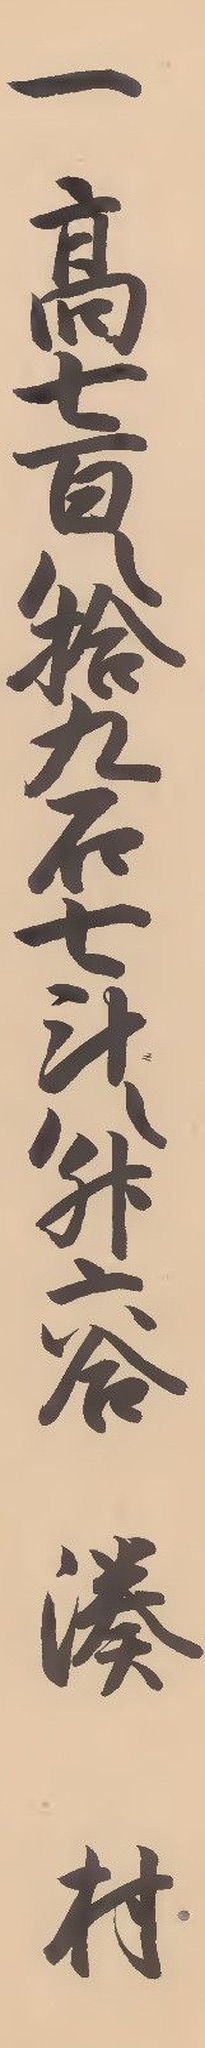一高七百八拾九石七斗八升六合湊村
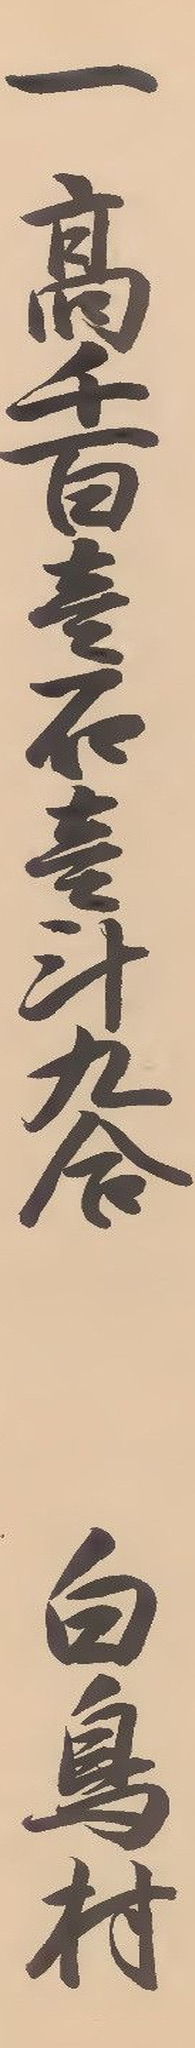一高千百壱石壱斗九合白鳥村
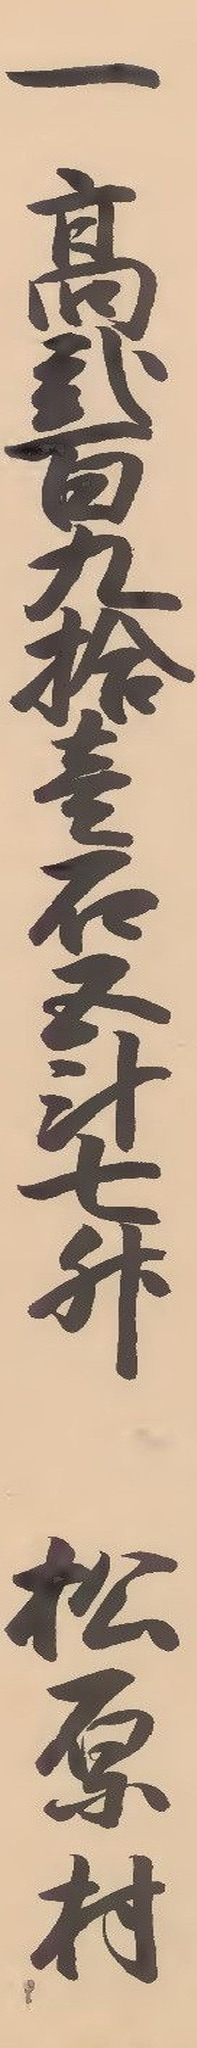一高弐百九拾壱石五斗七升松原村
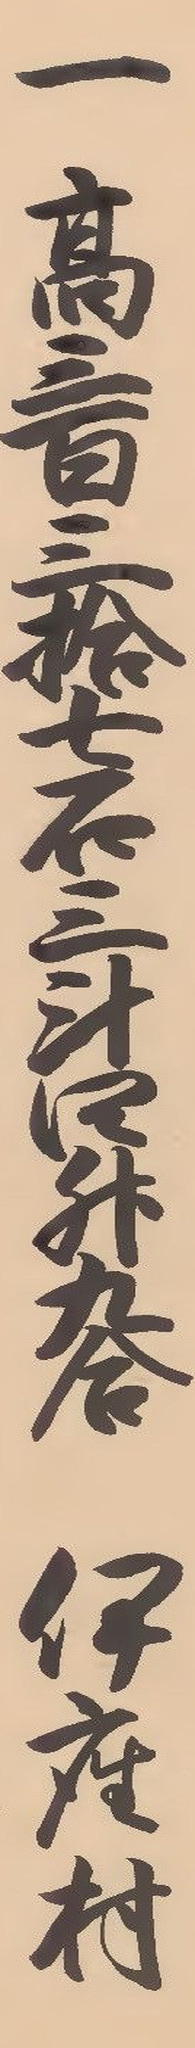一高三百三拾七石三斗四升九合伊座村
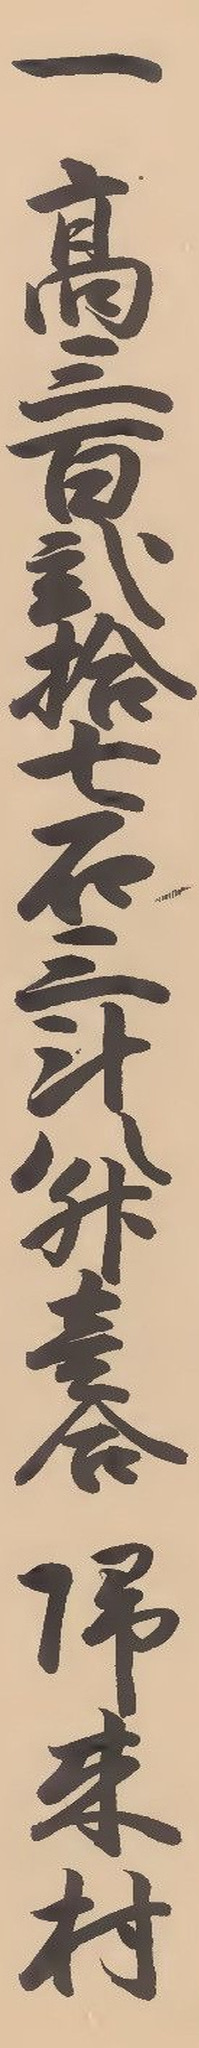一高三百弐拾七石三斗八升壱合帰来村
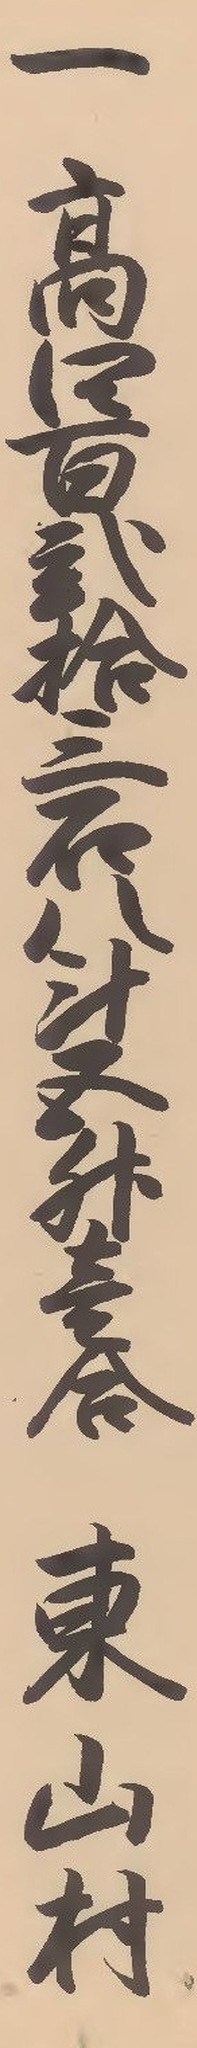一高四百弐拾三石八斗五升壱合東山村
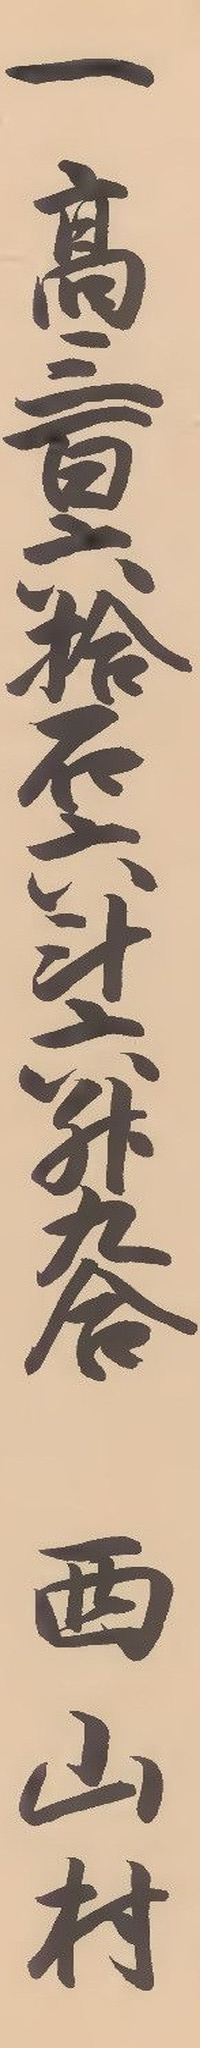一高三百六拾石六斗六升九合西山村
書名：讃岐国郷帳
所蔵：国立公文書館 National Archives of Japan
